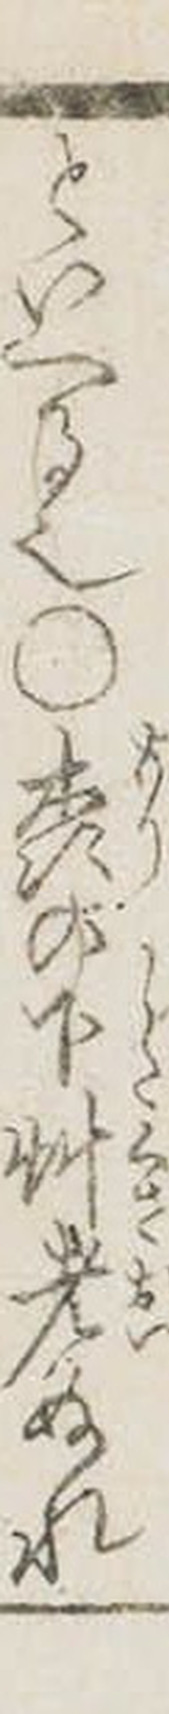といへる也○森の下草老ぬれ
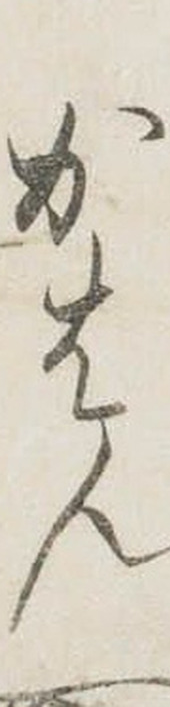かはん
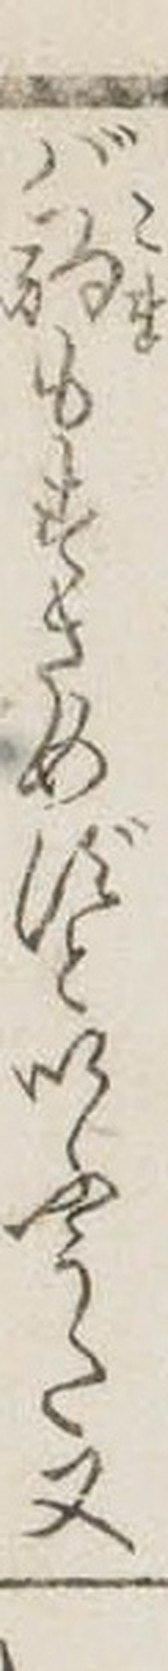ば駒もすさめずといふうた又
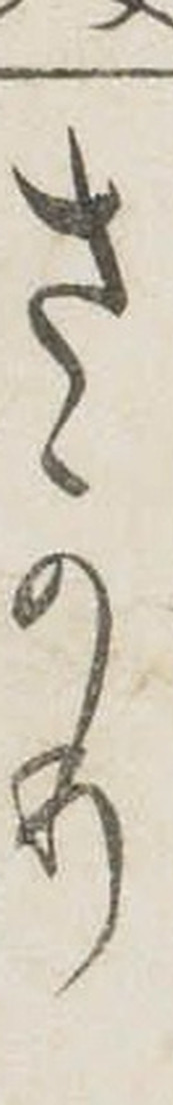さかり
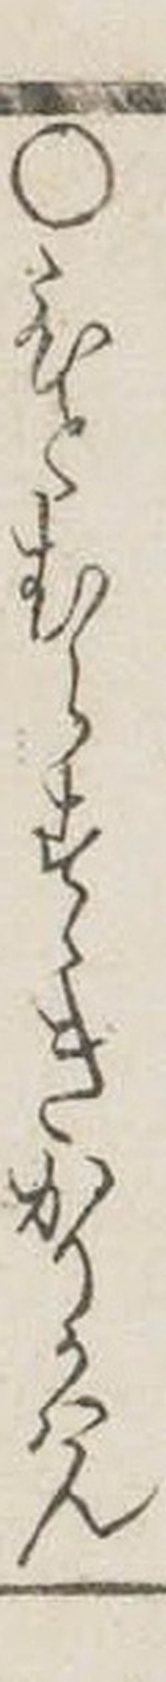○ひとむらすゝきかりかはん
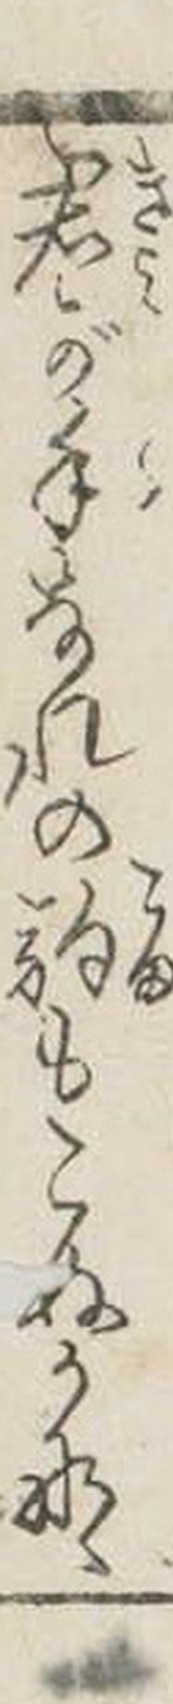君が手なれの駒もこぬかな
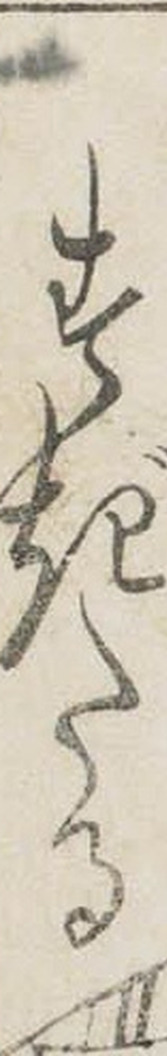すぎたる
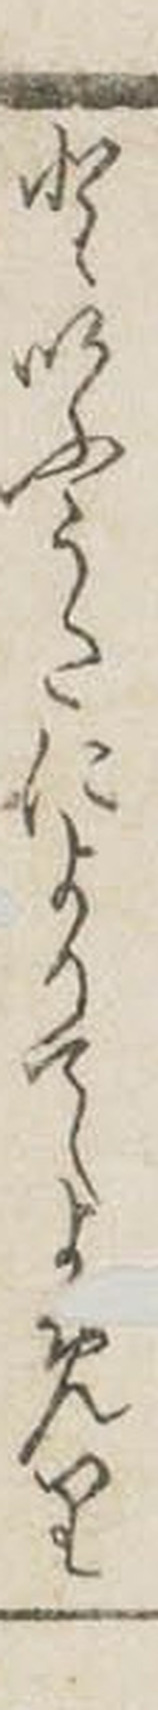といふうたによりてよめり
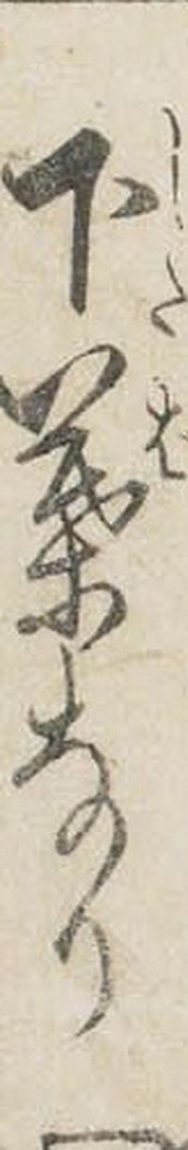下葉なり

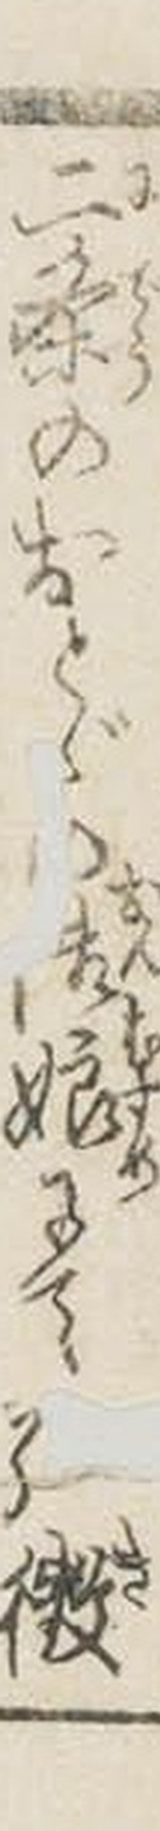二条のおとゞの御娘にて弘徽
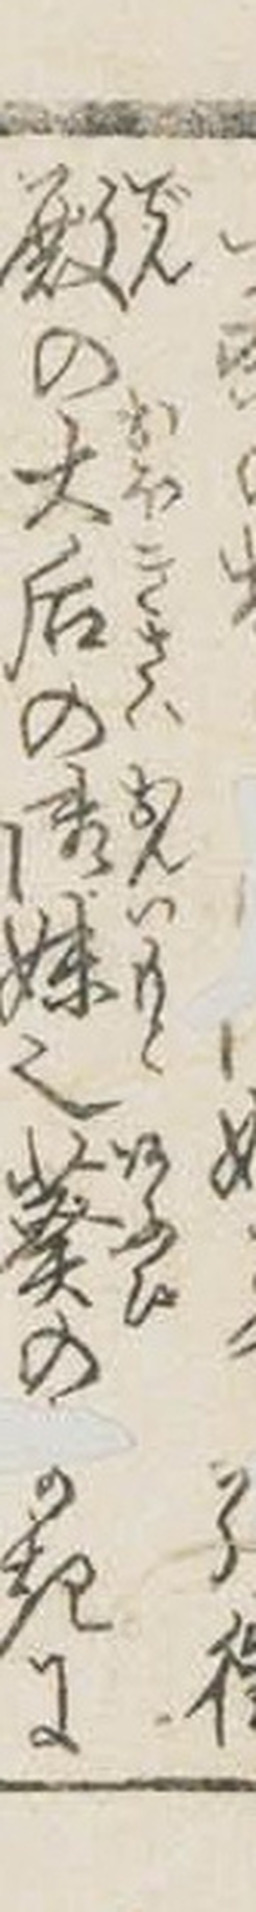殿の大后の御妹也葵のきに
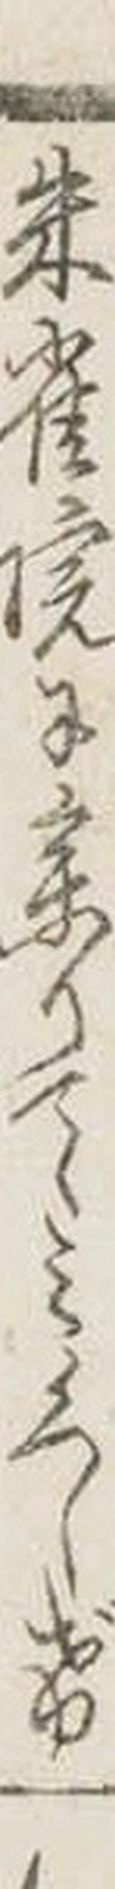朱雀院に参りてみくしげ
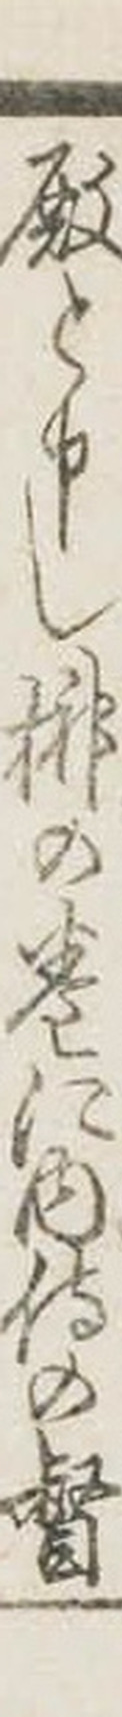殿と申し榊の巻に内侍の督
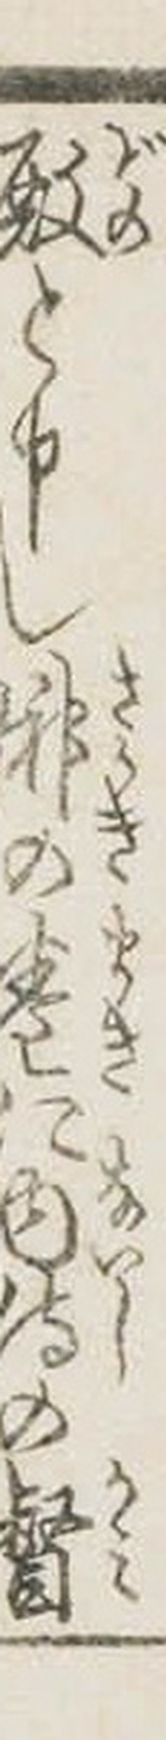殿と申し榊の巻に内侍の督
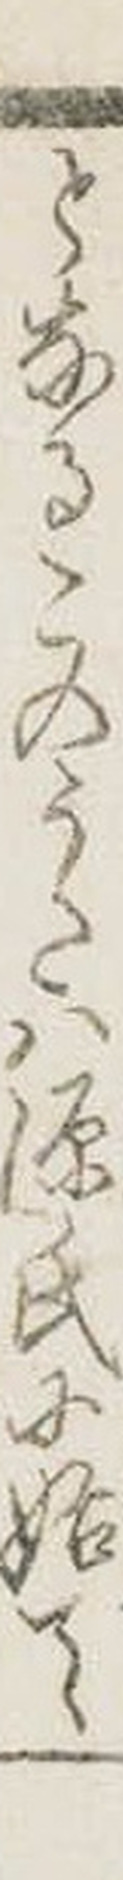となるこのうたは源氏に始て
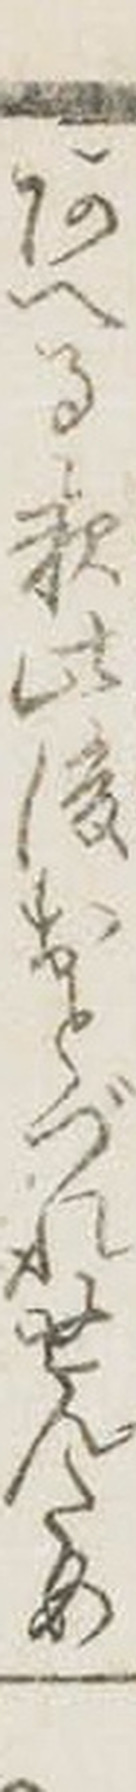あへる夜此後おとづれせんため
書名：源氏百人一首
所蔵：東京学芸大学教育コンテンツアーカイブ
